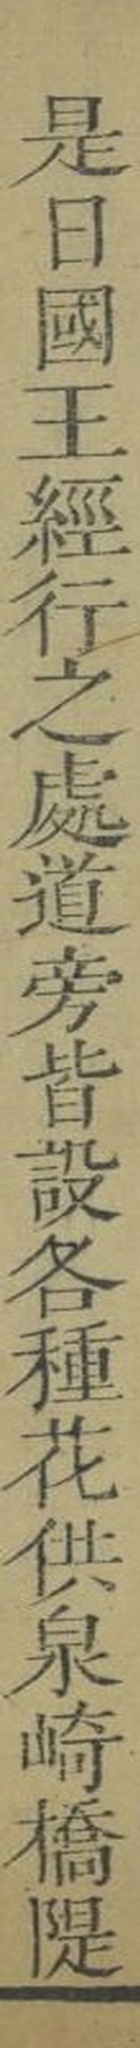是日國王經行之處道旁皆設各種花供泉崎橋隄
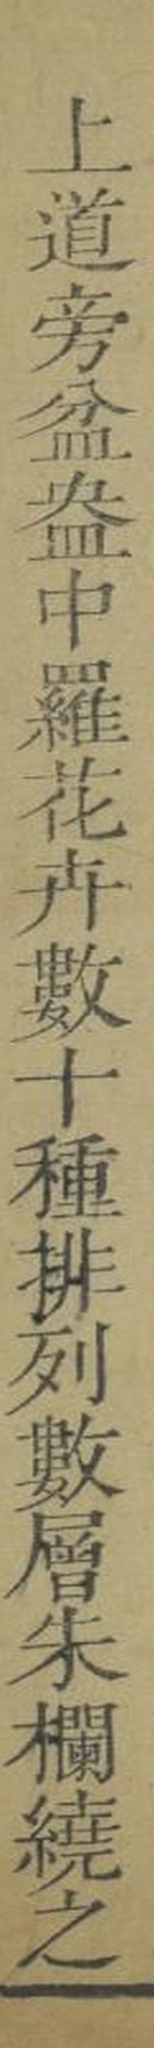上道旁盆盎中羅花卉數十種排列數層朱欄繞之
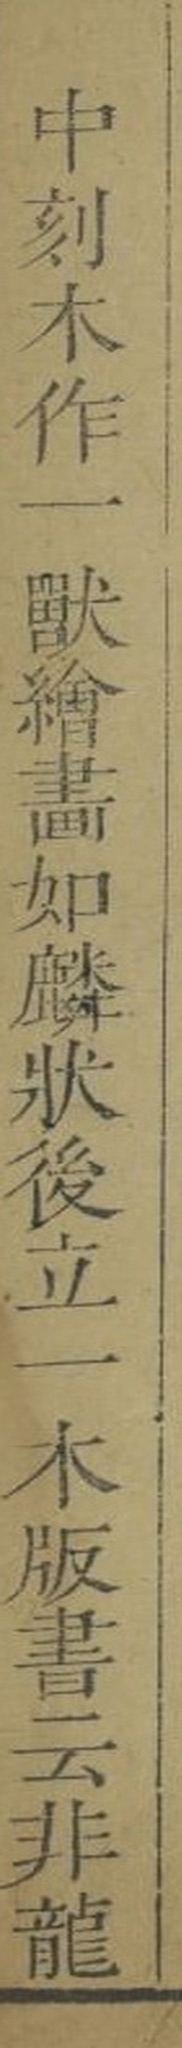中刻木作一獸繪畵如麟狀後立一木版書云非龍

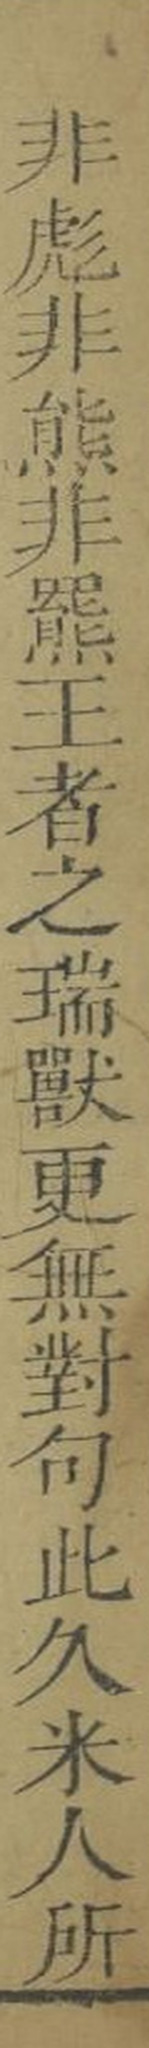非彪非熊非羆王者之瑞獸更無對句此久米人所
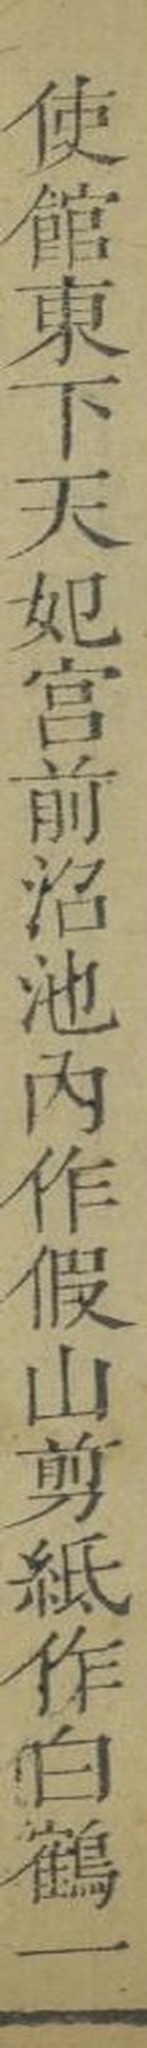使館東下天妃宫前沼池内作假山剪紙作白鶴一
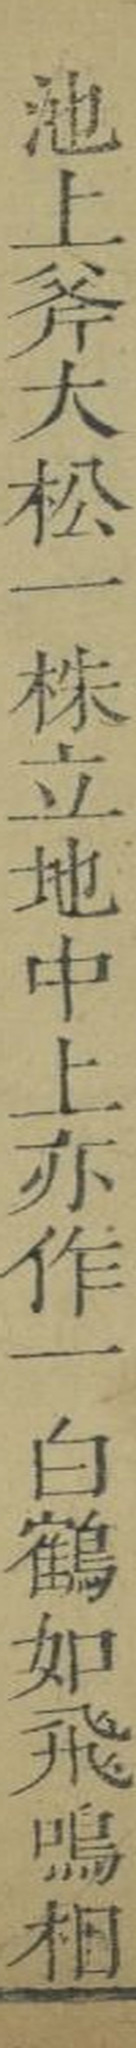池上斧大松一株立地中上亦作一白鶴如飛鳴相
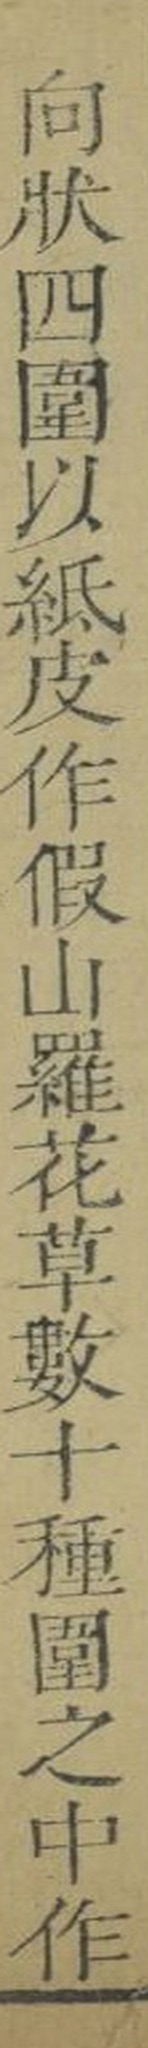向狀四圍以紙皮作假山羅花草數十種圍之中作
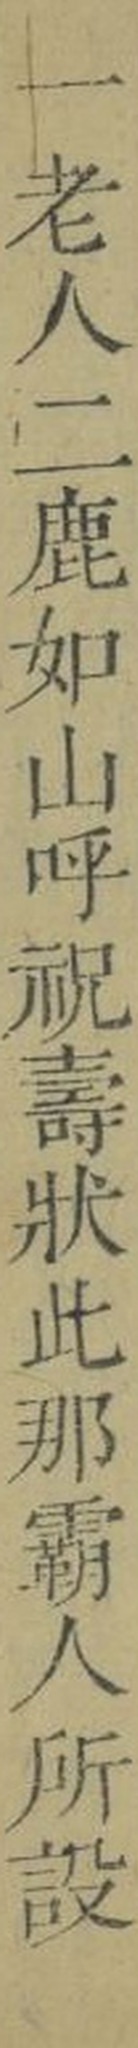一老人二鹿如山呼祝壽狀此那霸人所設

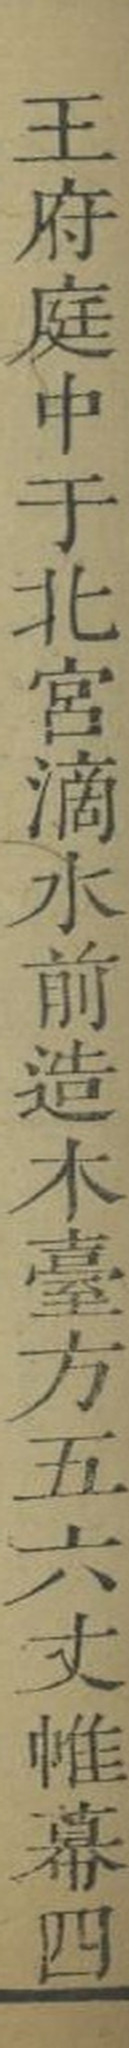王府庭中于北宮滴水前造木臺方五六丈帷幕四
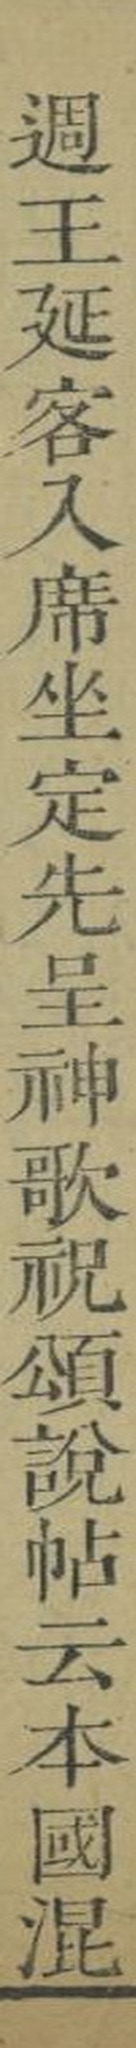週王延客入席坐定先呈神歌祝頌説帖云本國混
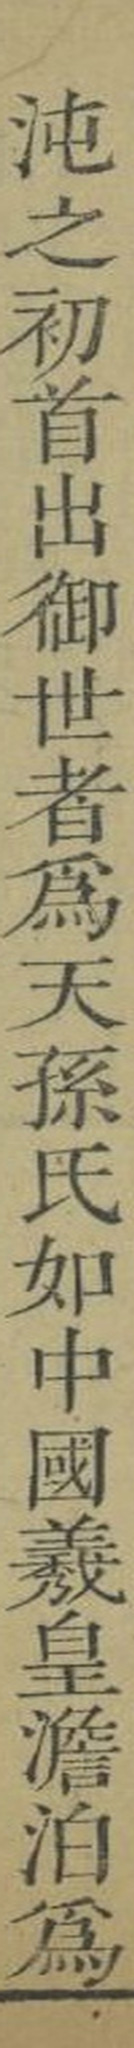沌之初首出御世者爲天孫氏如中國羲皇澹泊爲
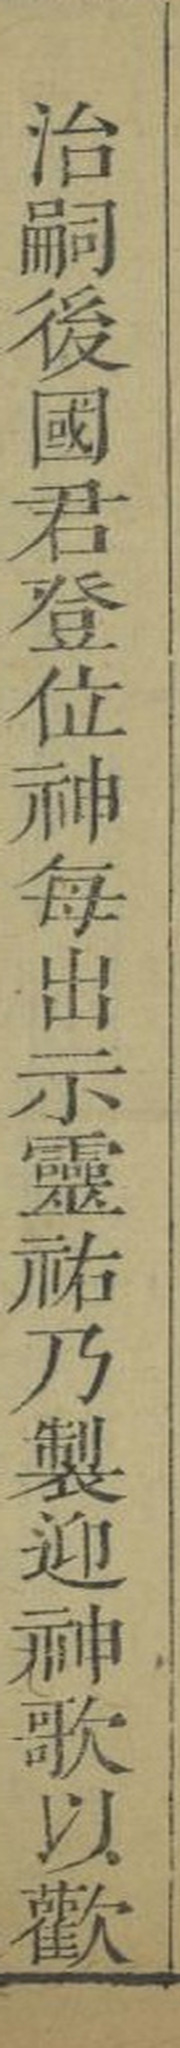治嗣後國君登位神每出示靈祐乃製迎神歌以歡
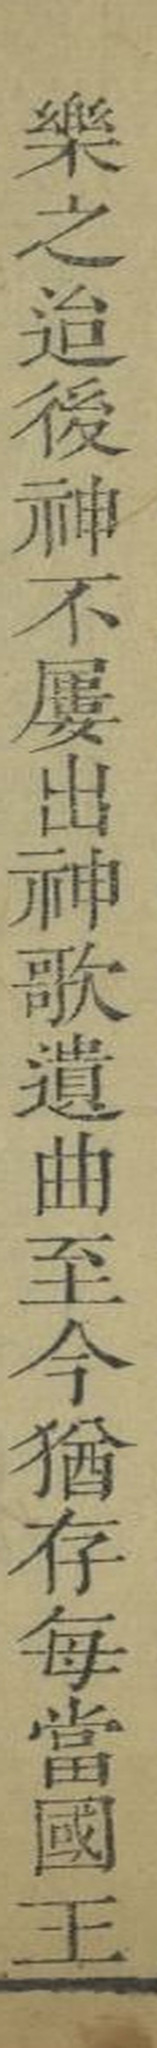樂之迨後神不屢出神歌遺曲至今猶存每當國王
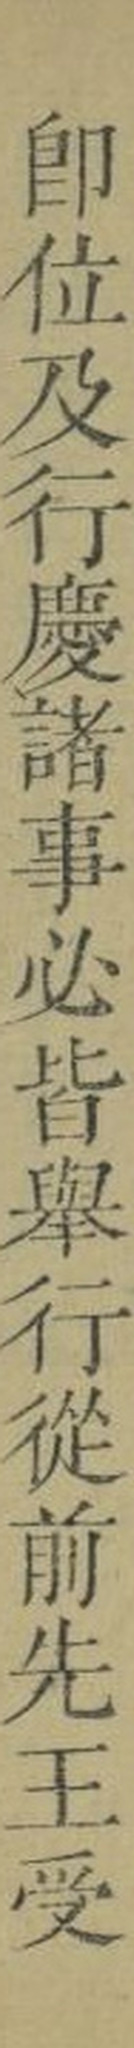卽位及行慶諸事必皆舉行從前先王受
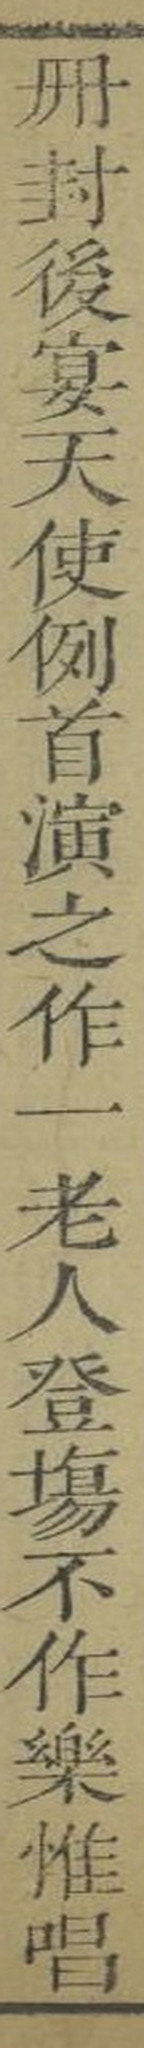冊封後宴天使例首演之作一老人登塲不作樂惟唱
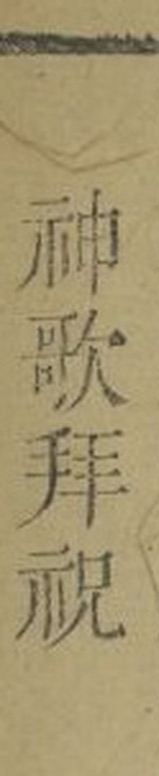神歌拜祝
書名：中山伝信録 巻二
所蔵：University of the Ryukyus Library
